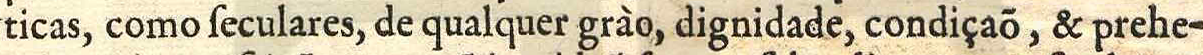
ticas, como seculares, de qualquer grào, dignidade, condiçaõ, & prehe
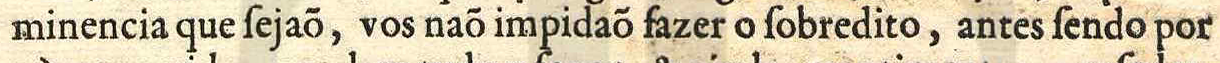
minencia que sejaõ, vos naõ impidaõ fazer o sobredito, antes sendo por
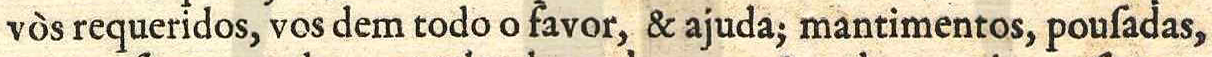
vòs requeridos, vos dem todo o favor, & ajuda; mantimentos, pousadas,
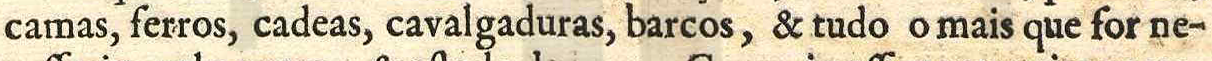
camas, ferros, cadeas, cavalgaduras, barcos, & tudo o mais que for ne
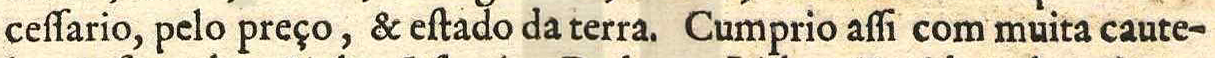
cessario, pelo preço, & estado da terra. Cumprio assi com muita caute
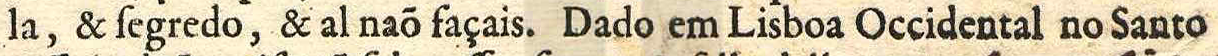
la, & segredo, & al naõ façais. Dado em Lisboa Occidental no Santo
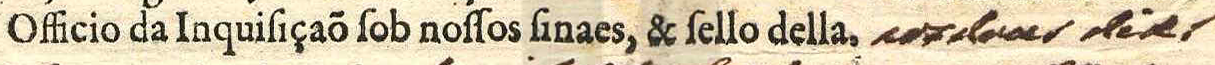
Officio da Inquisiçaõ sob nossos sinaes, & sello della, aos doues dias
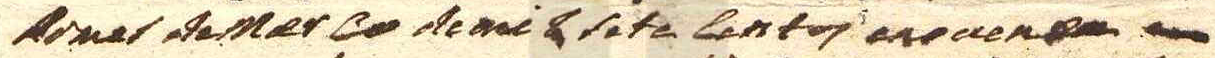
do mes de Março de mil seteCentos e noventa e
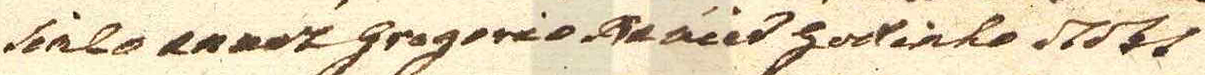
sinco annoz Gregorio Xavier Godinho o sobs
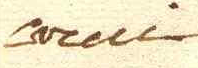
creui
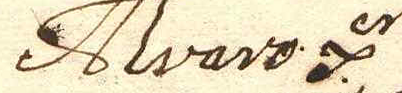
Alvaro x.er
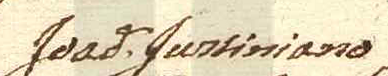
Joaõ Justiniano
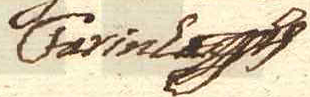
Farinha
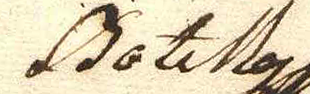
Botelho
